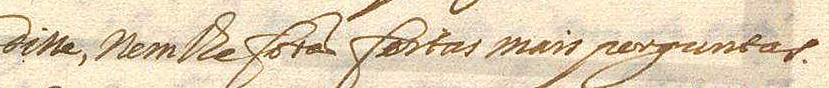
disse, nem lhe foraõ feitas mais perguntas.
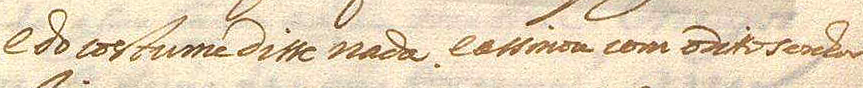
e do costume disse nada. e assinou com o ditto senhor
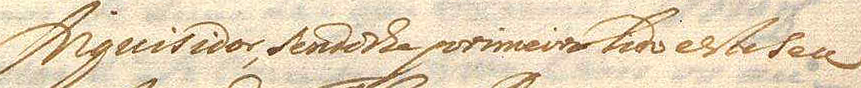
Jnquisidor, sendolhe primeiro lido este seu
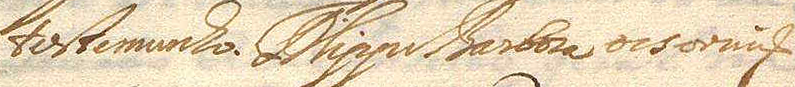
testemunho. Filippe Barboza o escreui
